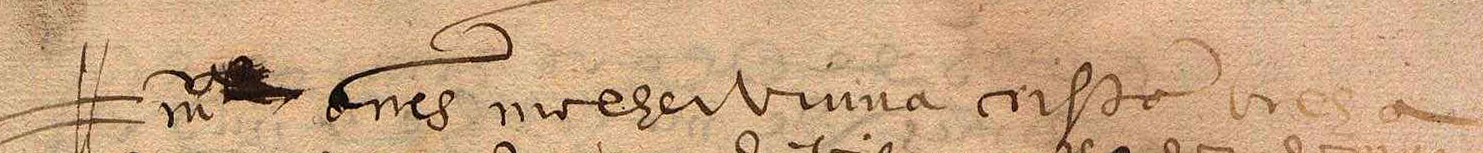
item maL ānes molher viuua cristā velha
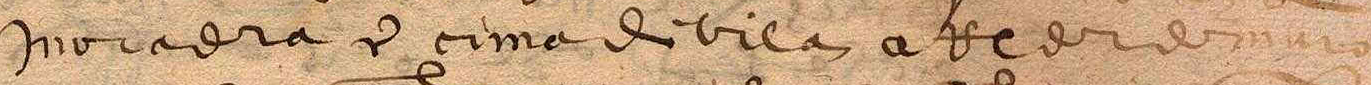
moradora ē cima de vila aRedor do muro
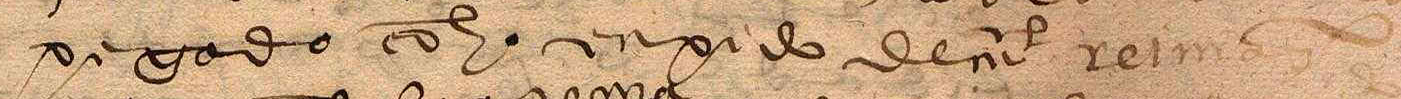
pegado cō ho enxido de mel reimão
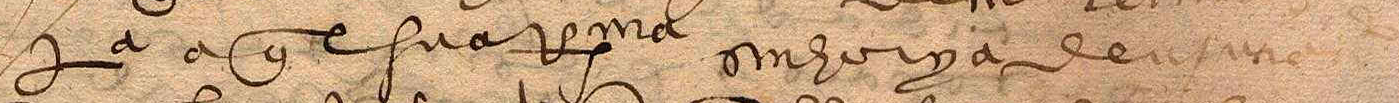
ta a q̄l Rꝭma senhorya deu juramto
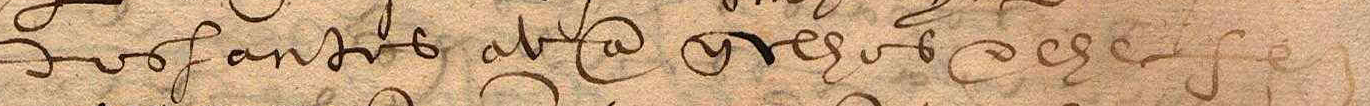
dos santos avāgelhos e lhe fez
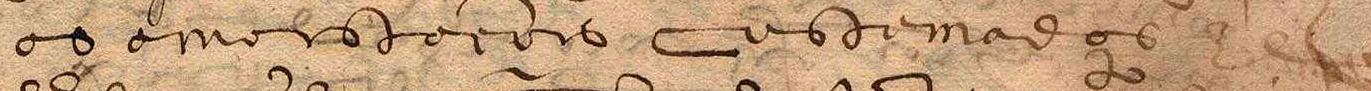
as amoestações custumadas he
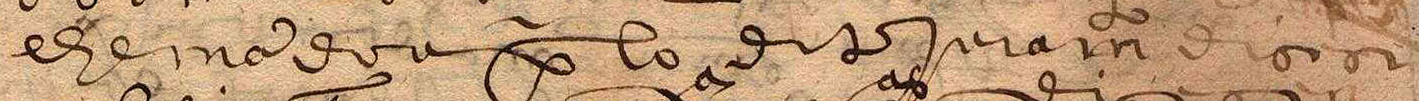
lhe mādou p̄lo dito Juramto disese
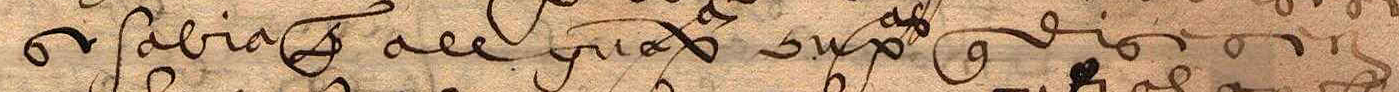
se sabia q̄ allgūa pa ou pas q̄ disesem
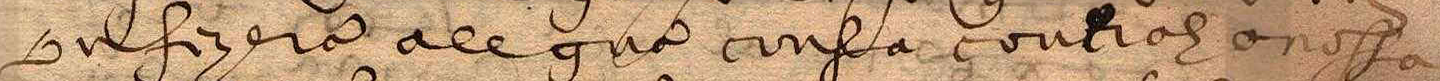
o fezerā allguā cousa contra ha nossa
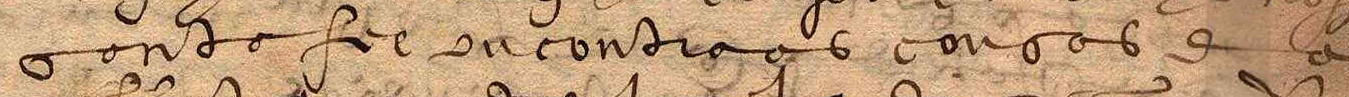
santa fee ou contra as cousas da
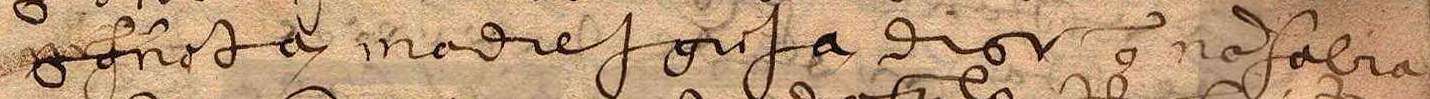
sancta madre JgreJa dise q̄ nā sabia
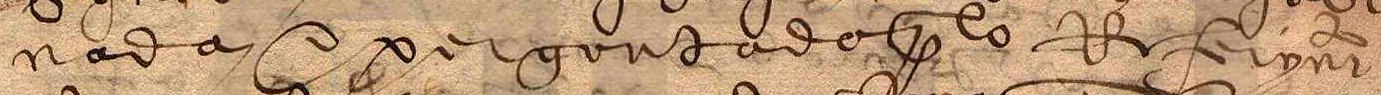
nada, e perguntado p̄lo Referymto
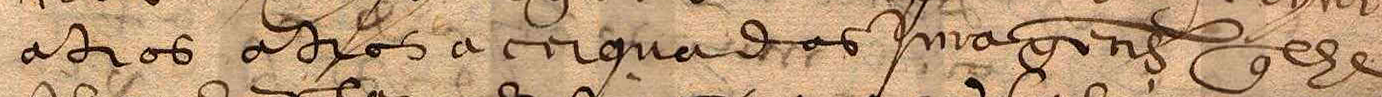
atras atras acerqua das Jmagens q̄ lhe
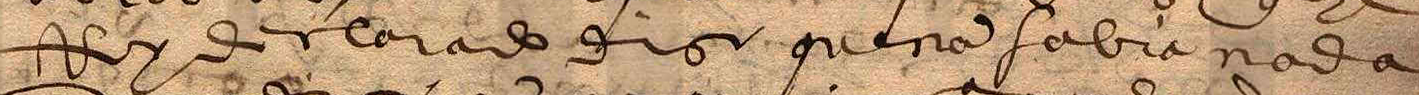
ffoy declarado dise que nā sabia nada
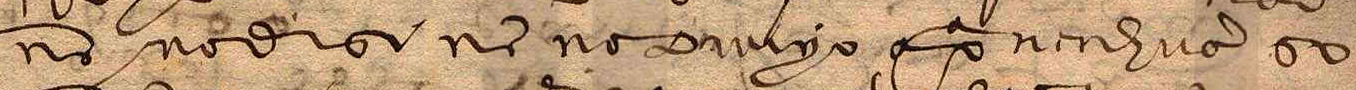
nē no dise nē no ouuyo a pa nenhuā so
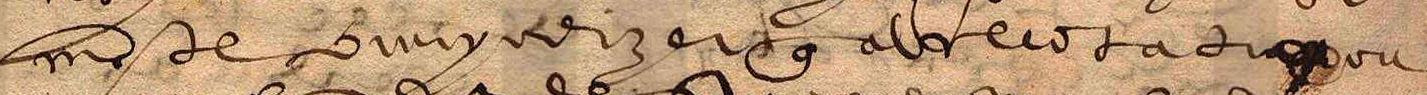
mēte ouuyo dizer q̄ a vellota tr_ou
